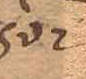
Sōr
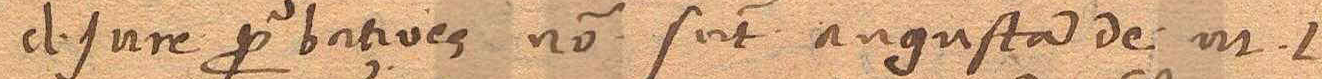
de Jure ꝓobatioes nō sint̄ augustā de ut .l.
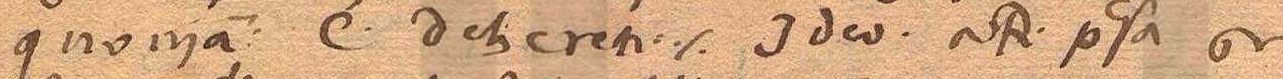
quonjā: C. dehcreti ./. Jdeo. a R. p̄sa se
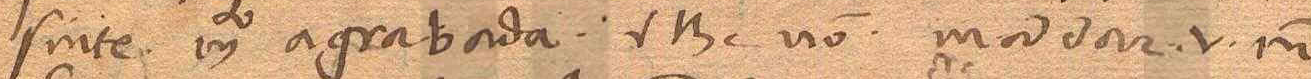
sinte mto agravada ē lhe nō. mādar. v. m̄.
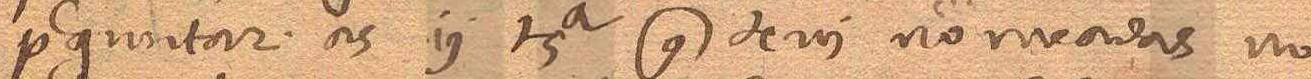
p̄guntar. as i9 tsa q̄ tem nomeadas no
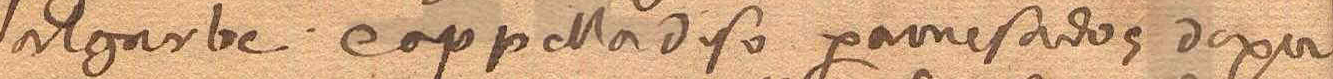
algarve. e appella diso ꝑ a mesa dos depu
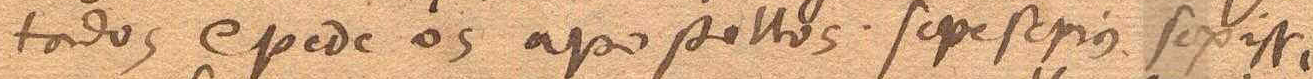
tados e pede os apostollos. sepe sepiꝯ sexissi
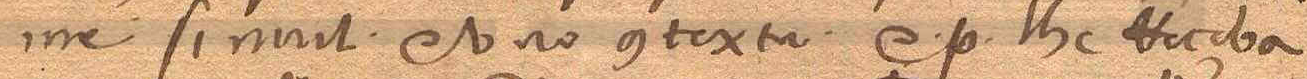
me simul. e vero ꝯtestu. e ꝑ. lhe Reçeba
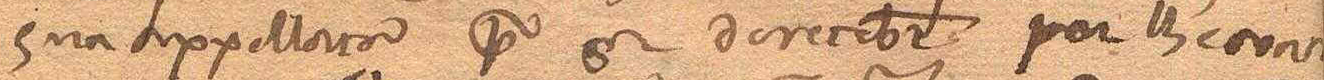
sua appellacā p̄o ser de receb̄r por lhe coar
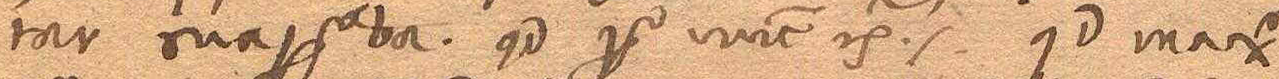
tar sua ꝓova. qd ꝓomic̄ cꝭ̄./ qd maxn
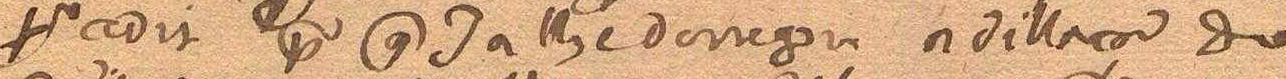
ꝓoçedit p̄oq̄ Ja lhe denegou a dillaçā do
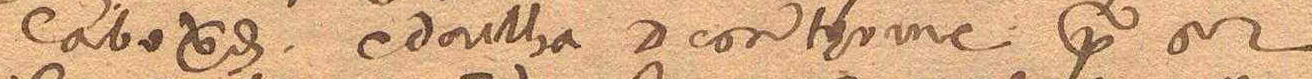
cabo ꝟde. e da ilha de sā thome p̄o ser
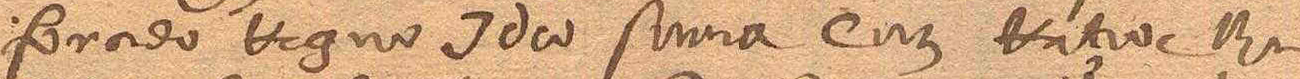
fora do Regno Jdeo sintia cuꝫ Raçio e lhe
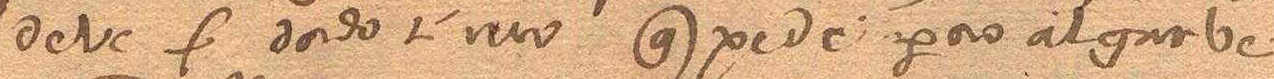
deve ꞩ dado te mo q̄ pede ꝑa o algarve
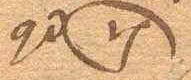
qd c̄ꝭ
